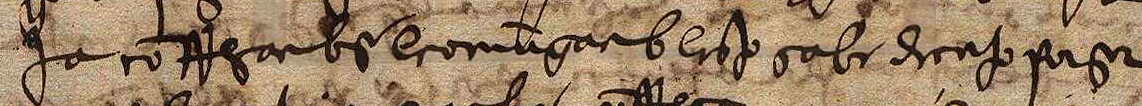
Ja cōffesandose e comūgando e isto sabe de caso por ser
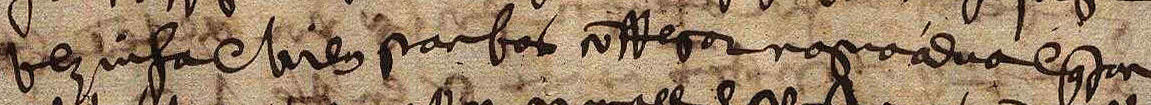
vezinha e virem se ambas cōffesar na sua adua e q̄ tam
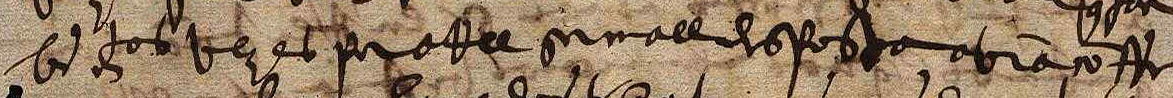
bē mtas vezes por a Ree ser mall desposta a via cōffe
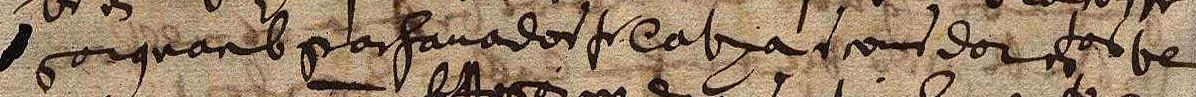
sar quando se achaua doēte e a vya ēcomēdar mtas ve
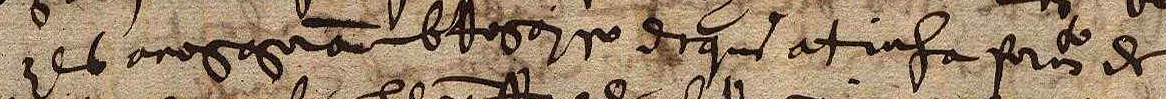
zes a nosa snā do Rosajro de quē a tinha por mto de
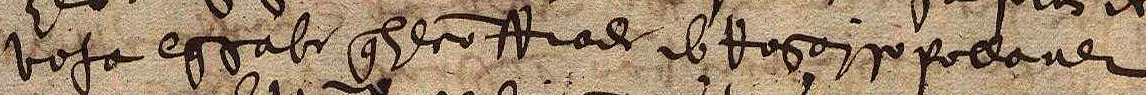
vota e q̄ sabe q̄ he c̄offrade do Rosajro polla uer
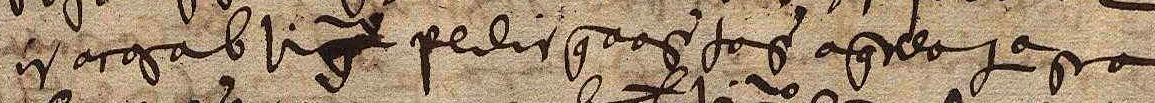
ir a casa do vigro pedir q̄ a asētasē a q̄ ella ta se a
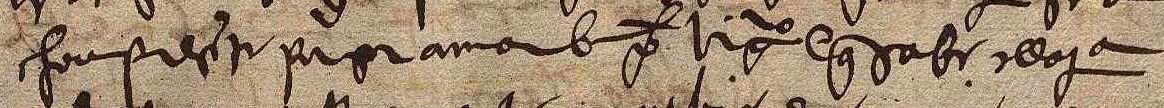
chou presēte por ser ama do ħo vigro e q̅ sabe ella ta
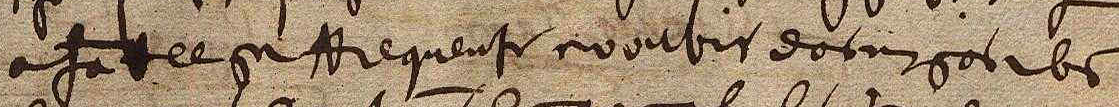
a ħa Ree ser ffrequente no ouvir das mjsas dos
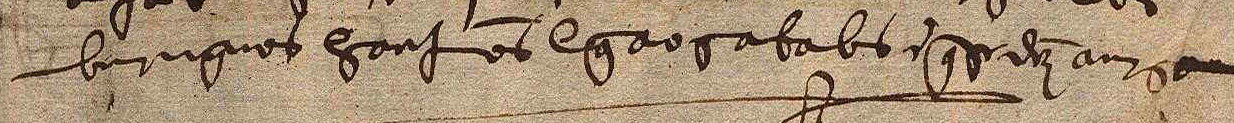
domjnguos santōs e q̄ ao sabados ē q̄ se diz̄ a mjsa
